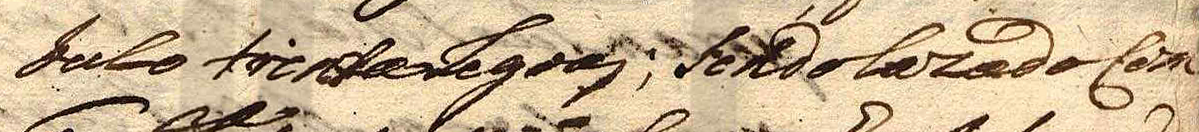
buCo trinta Legoas; sendo Cazado Com
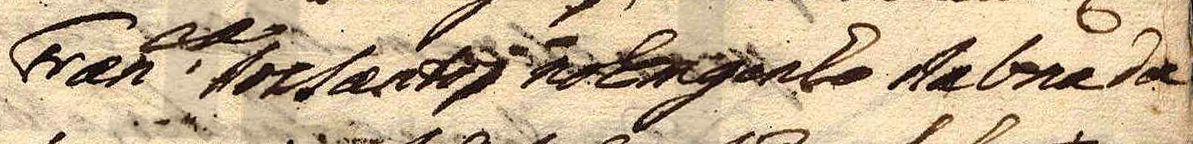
França Aos Santos no Emgenho da vna da
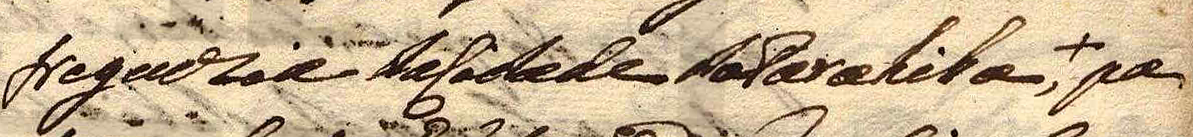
freguezia da Cidade da Parahiba,+ pa
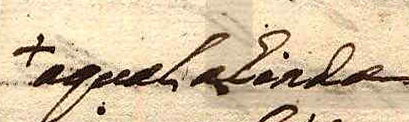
+aqual ahinda
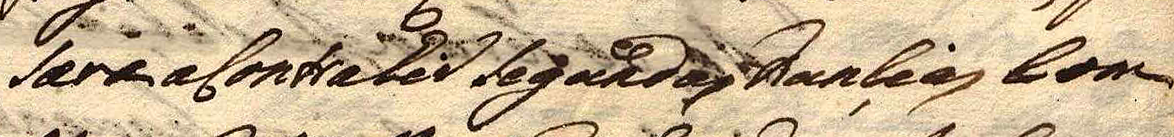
sara a Contrahir segundas nunÇias com
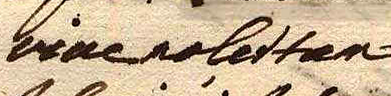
viue no Çertam
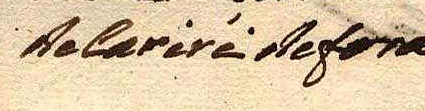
de Carire de fora
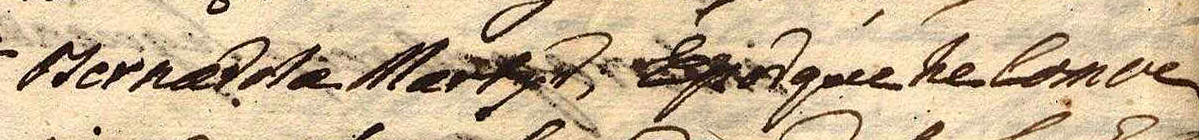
Bernarda Martyr, E por que he Comve
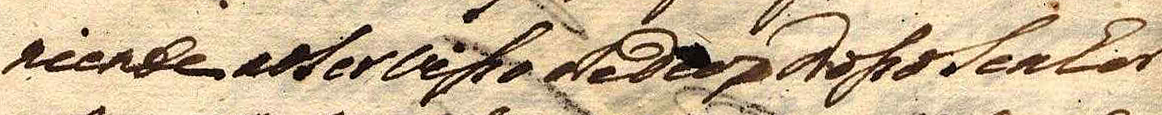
niente ao servisso de Deos nosso senhor
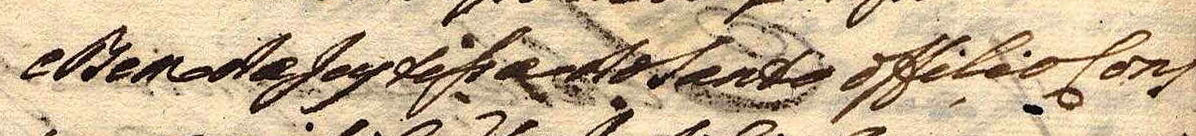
e bem da Justissa do santo offiÇio Cons
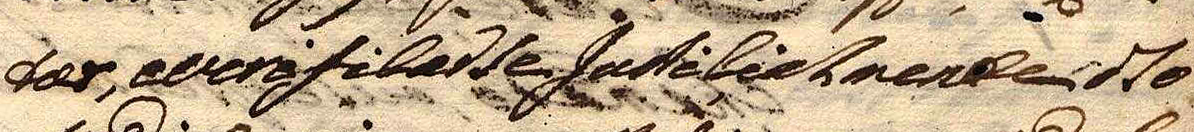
tar, e verifiCarse JudiÇialmente o so
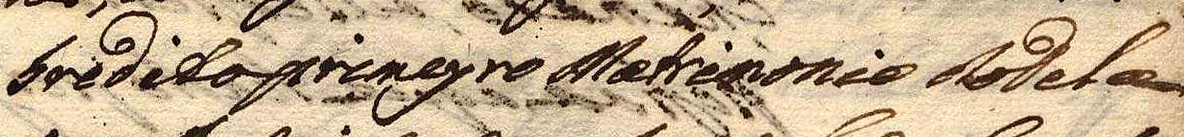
bredito premeyro Matrimonio do Dela
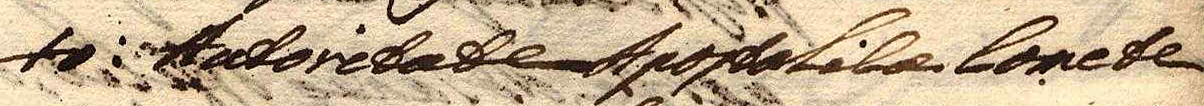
to Autoritate ApostoLiCa Comete
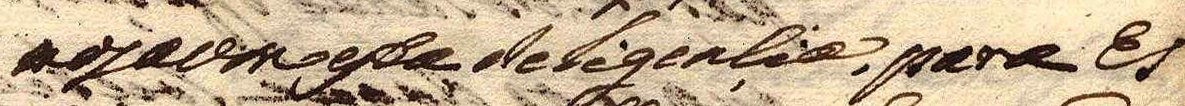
moz a vm esta deligenÇia, para es
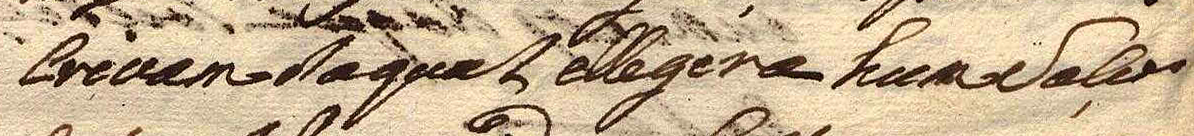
crevam da qual ellegera hum Saçer
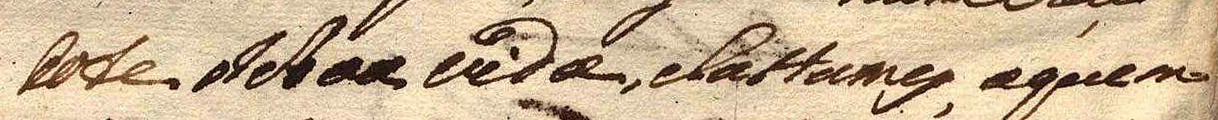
dote de boa vida, custumes, a quem
